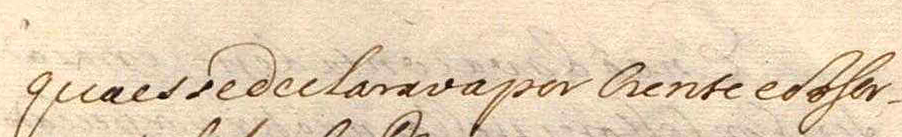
quaes se declarava por crente e obser
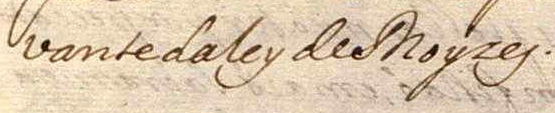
vante da ley de Moyzes.
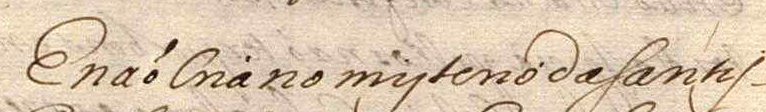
E naõ Cria no misterio da santis
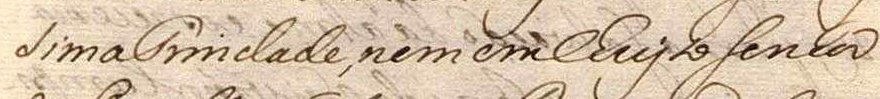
sima Trindade, nem em Christo senhor
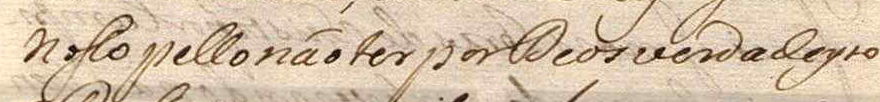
nosso pello não ter por Deos verdadeyro
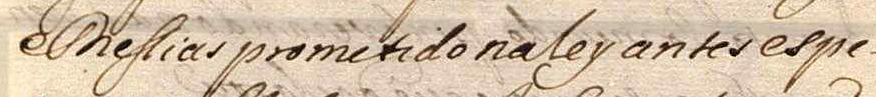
e Messias prometido na ley antes espe
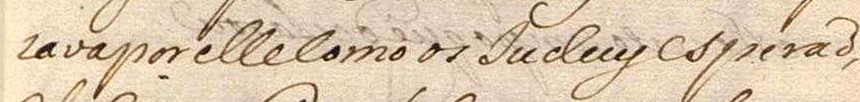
rava por elle como os Iudeus esperaõ
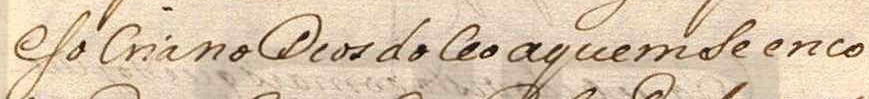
E so Cria no Deos do Ceo a quem se enco
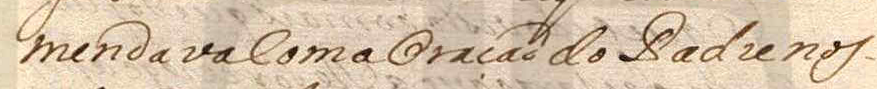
mendava Com a Oraçaõ do Padre nos
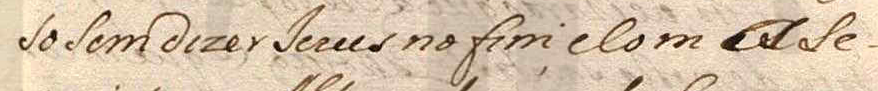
so sem dizer Iesus no fim, e com A se
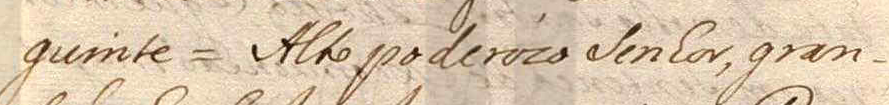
guinte = Alto poderozo senhor, gran
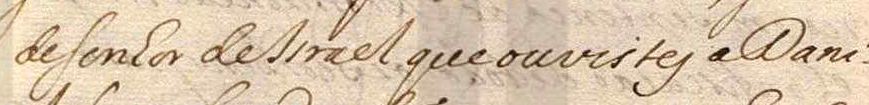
de senhor de Israel que ouvistes a Dani
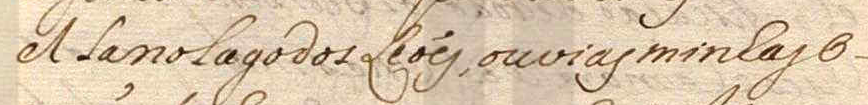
el la no lago dos Leoẽs, ouvi as minhas o
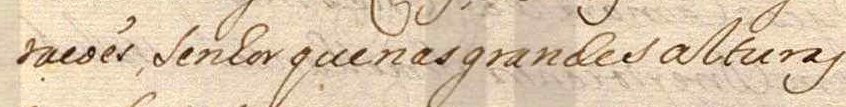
raçoẽs, senhor que nas grandes alturas
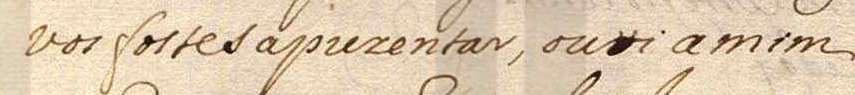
vos fostes aprezentar, ouvi a mim
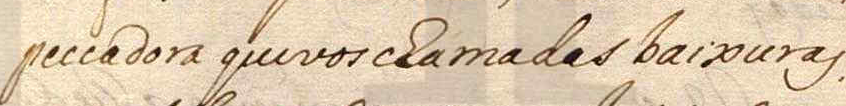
peccadora que vos chama das baixuras,
